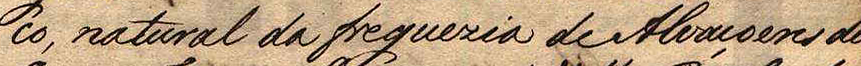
co, natural da freguezia de Alvaçoens do
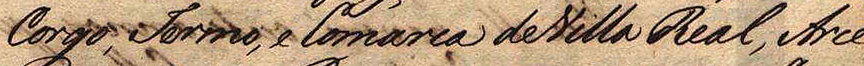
Corgo, Termo, e Comarca de Villa Real, Arce
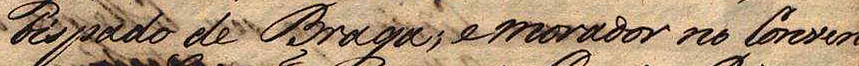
bispado de Braga; e orador no Conven
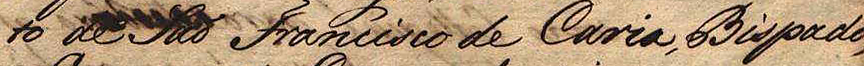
to de Saõ Francisco de Caria, Bispado
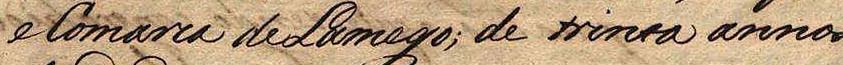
e Comarca de Lamego; de trinta annos
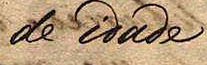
de idade.
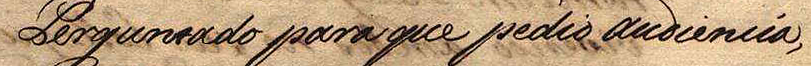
Perguntado para que pedio audiencia,
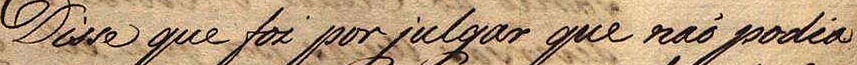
Disse que foi por julgar que naõ podia
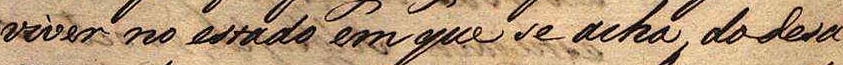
viver no estado em que se acha do desa
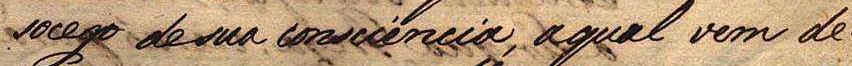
socego de sua consciencia, a qual vem de
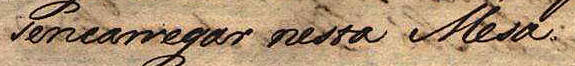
sencarregar nesta Mesa.
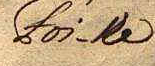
Foi-lhe
